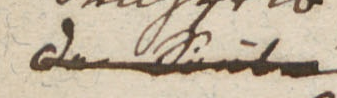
dem Haupte des
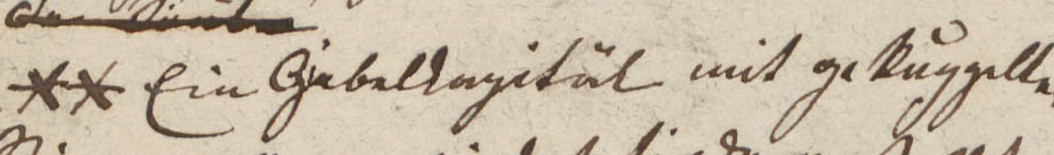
% Ein Giebelkapitäl mit gekuppelten
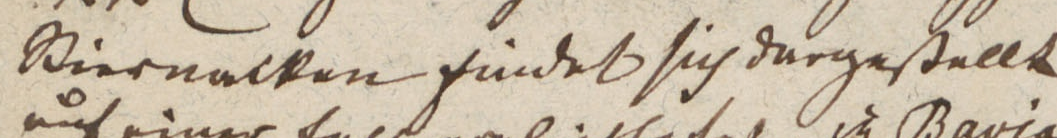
Stiernacken findet sich dargestellt
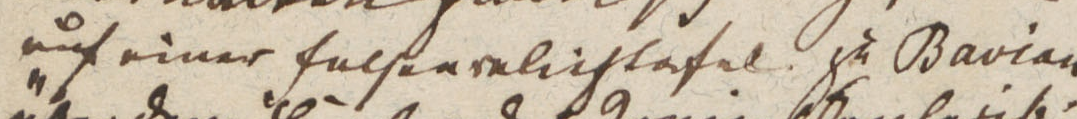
auf einer Felsenrelieftafel zu Bavian
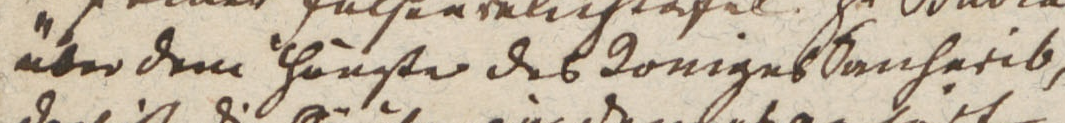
über dem Haupte des Koniges Sanherib;
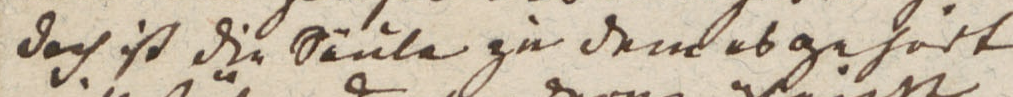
doch ist die Säule zu dem es gehört
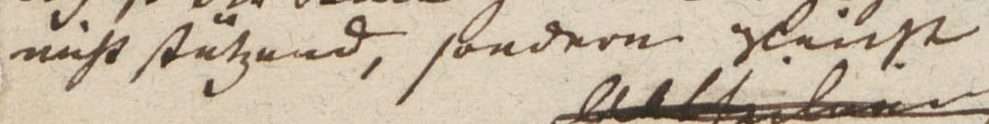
nicht stützend, sondern gleicht
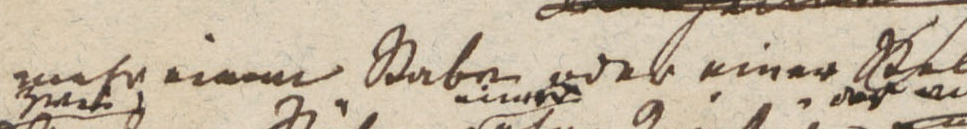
mehr einem Stabe oder einer Stele.
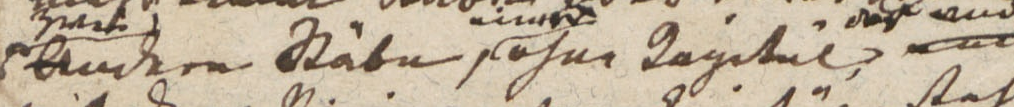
Aandere Stäbe, einer ohne Kapitäl, der andere
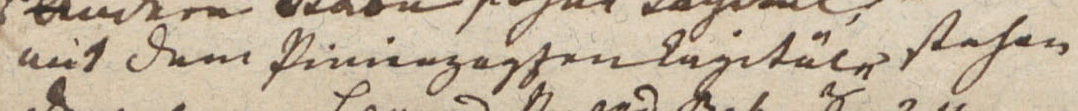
mit dem Pinienzapfenkapitäle stehen
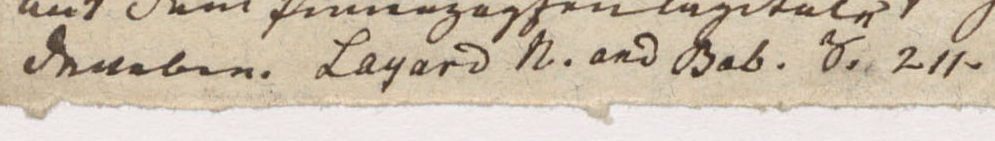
daneben. Layard N. and Bab. S. 211.
